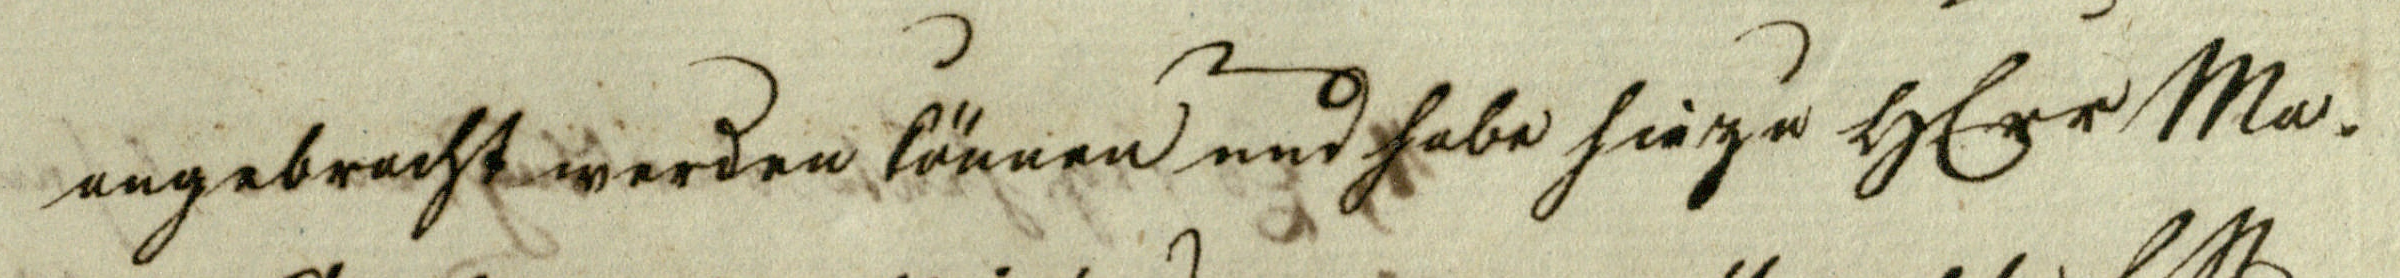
angebracht werden können und habe hiezu Herr Ma¬
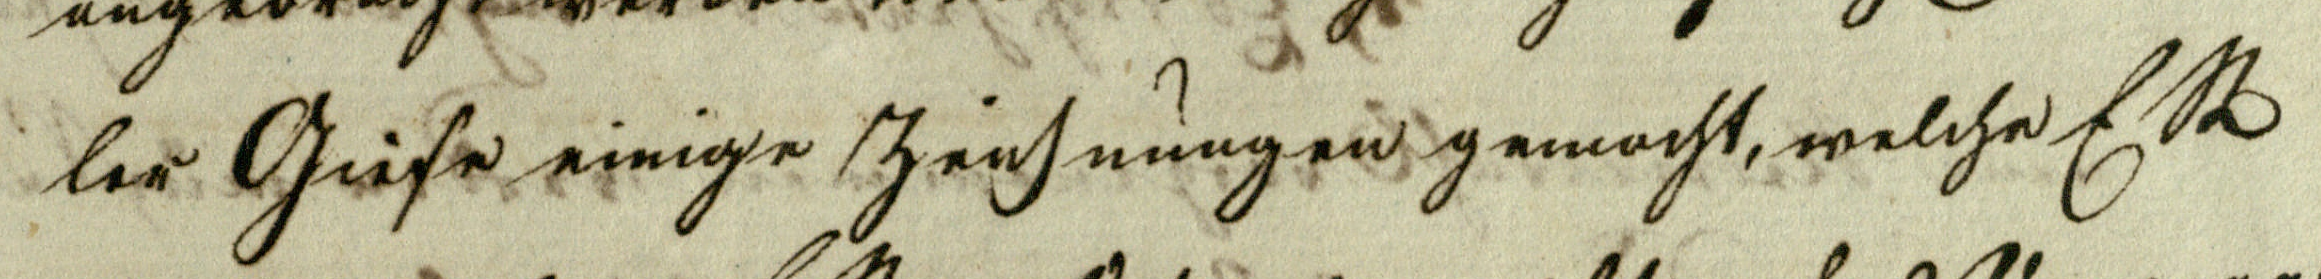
ler Giese einige Zeichnungen gemacht, welche E R
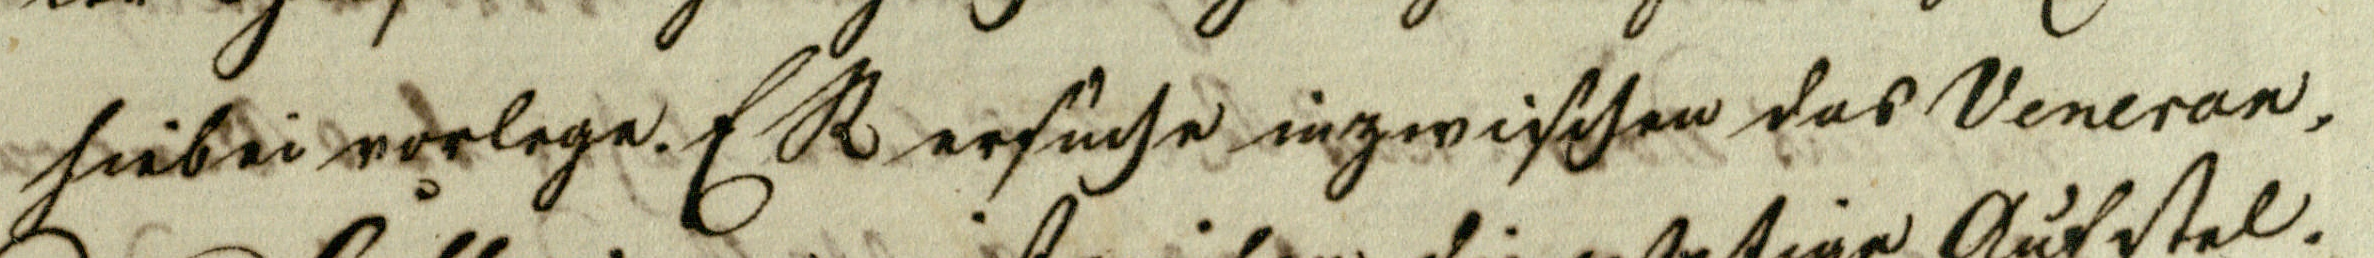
hiebei vorlege. E R ersuche inzwischen das Veneran¬
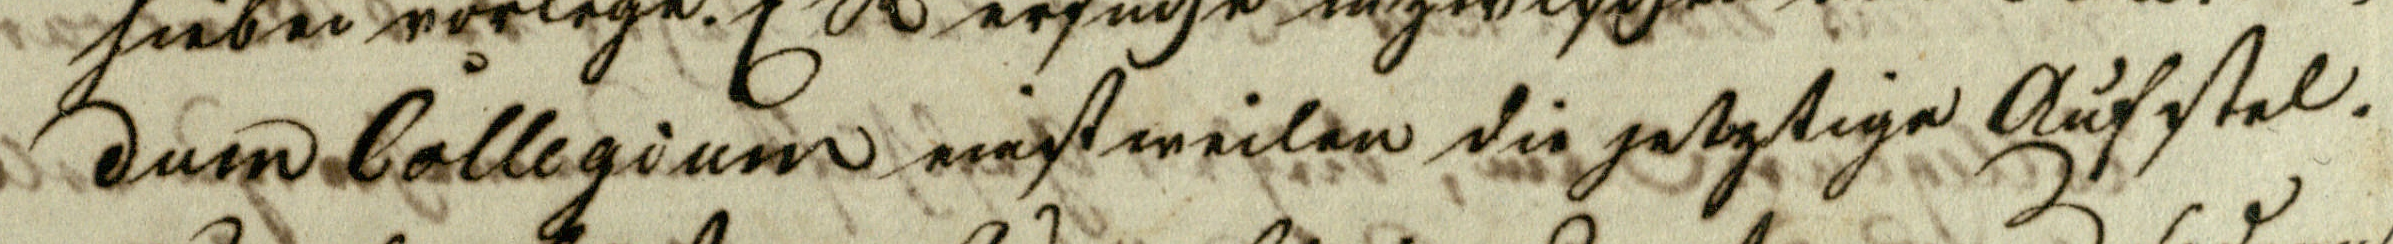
dum Collegium einstweilen die jetzige Aufstel¬
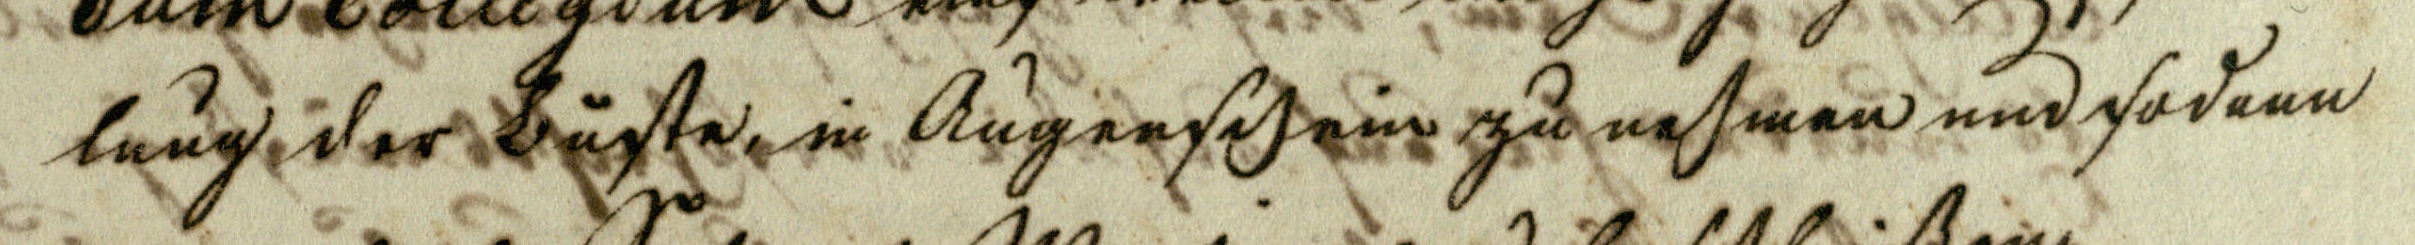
lung der Büste in Augenschein zu nehmen und sodann
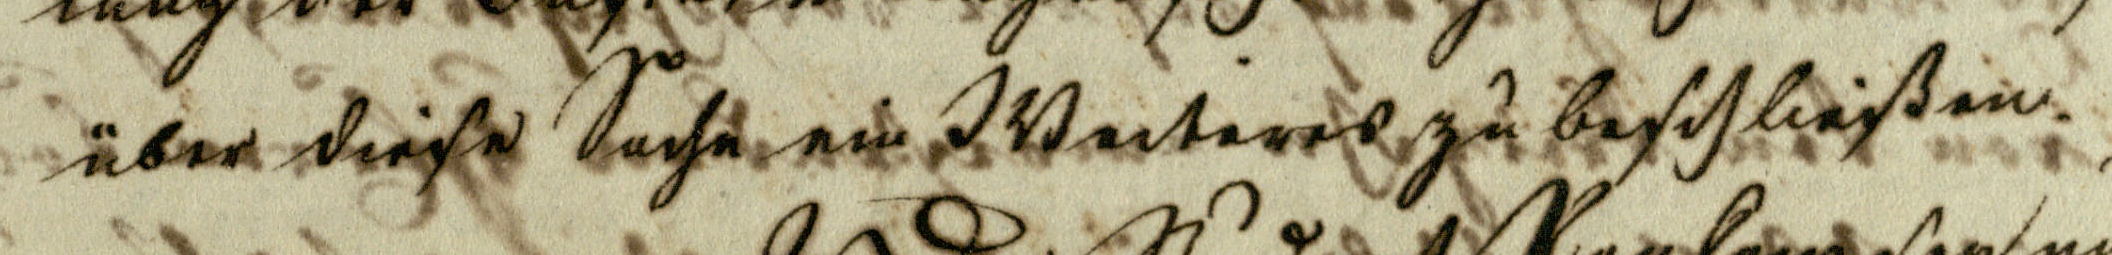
über diese Sache ein Weiteres zu beschließen.
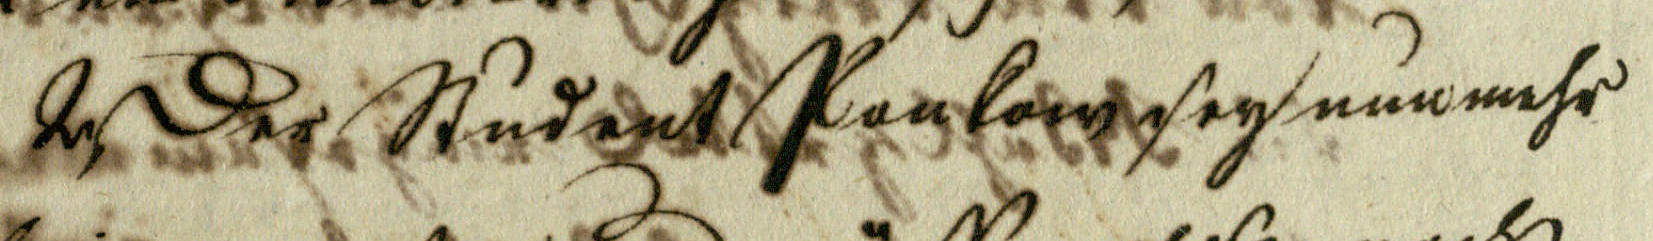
2. Der Student Pankow sey nunmehr
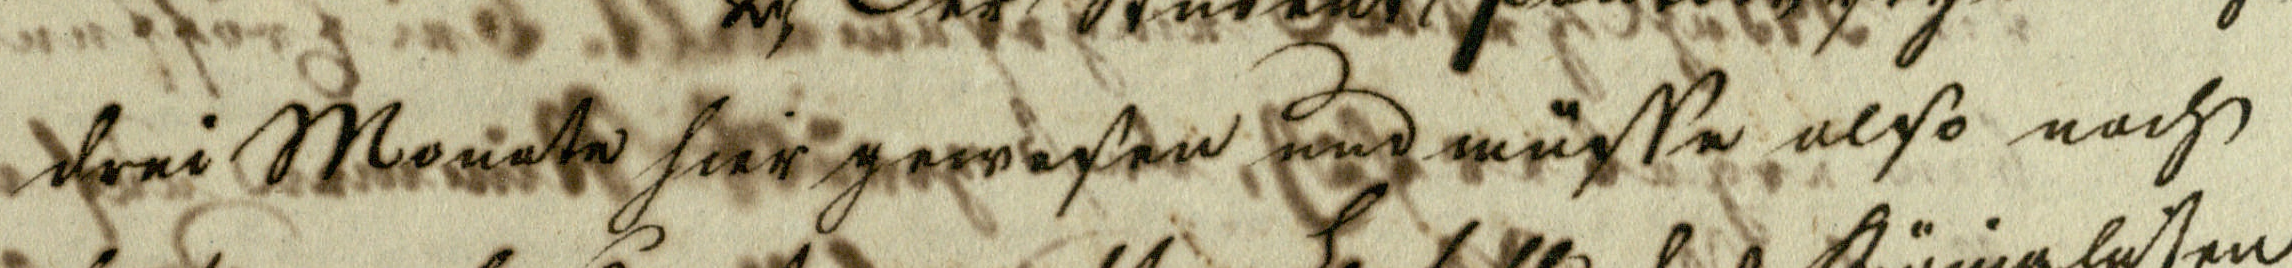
drei Monate hier gewesen und müsse also nach
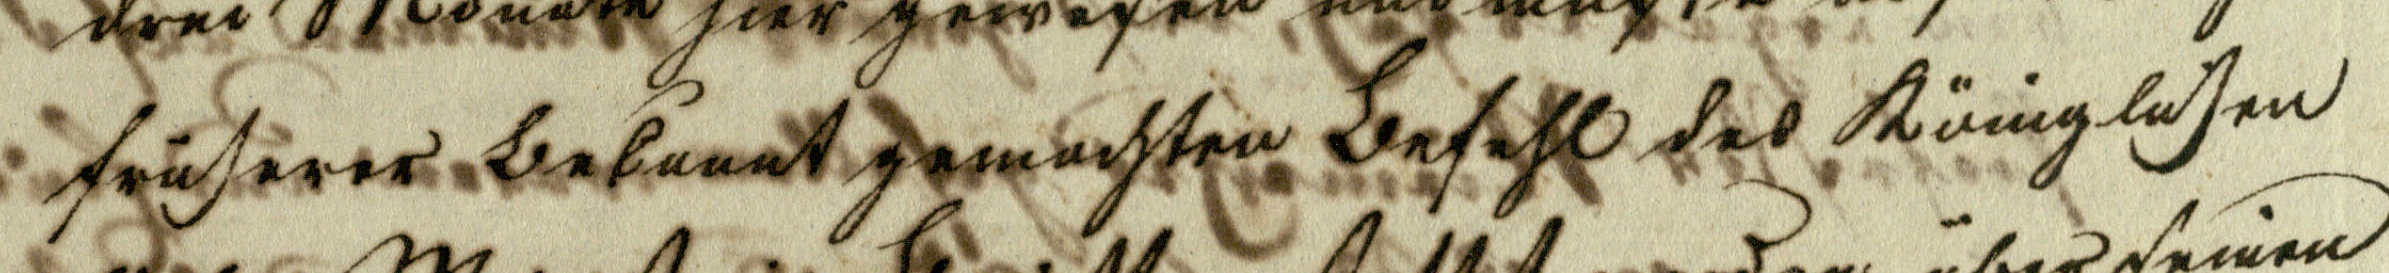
früherer bekannt gemachten Befehl des Königlichen
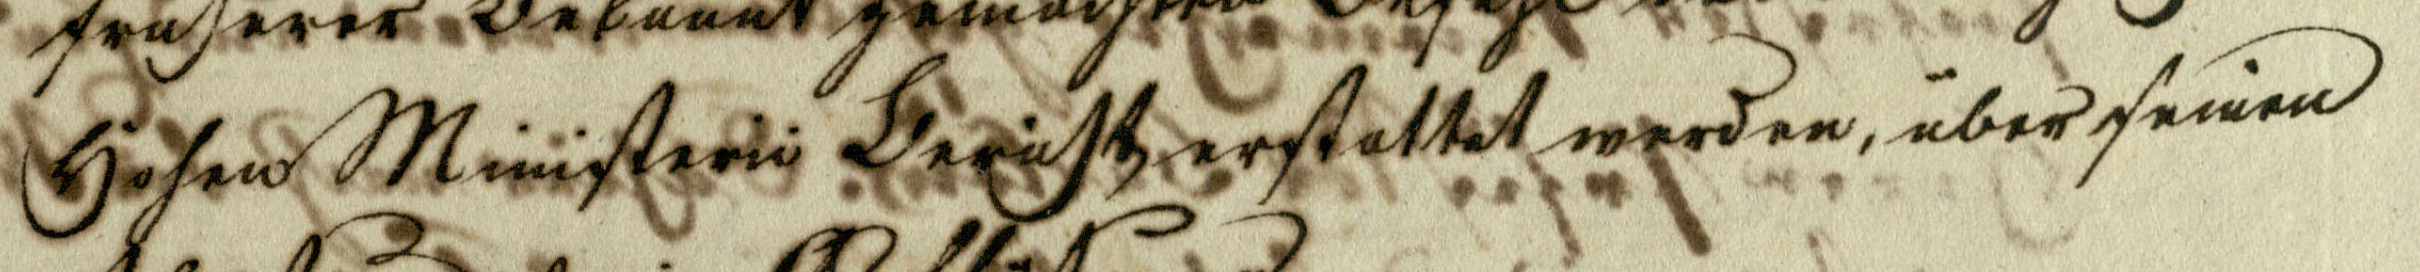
Hohen Ministerii Bericht erstattet werden, über seinen
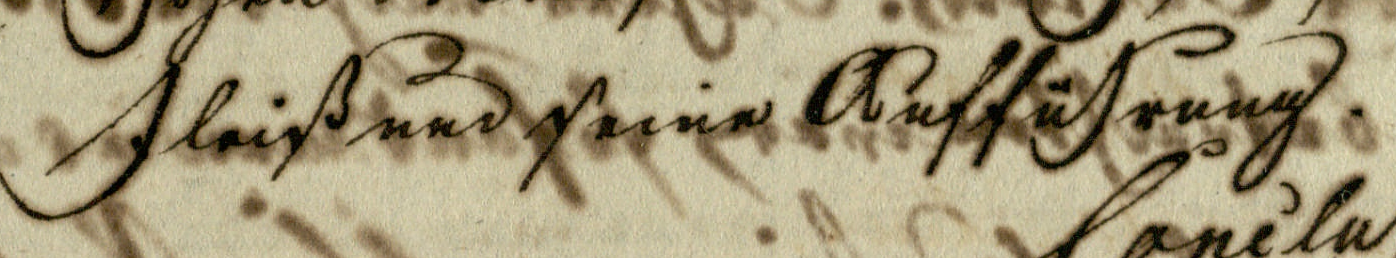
Fleiß und seine Aufführung.
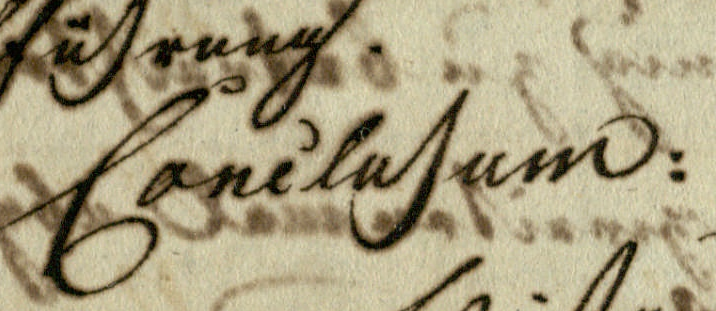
Conclusum:
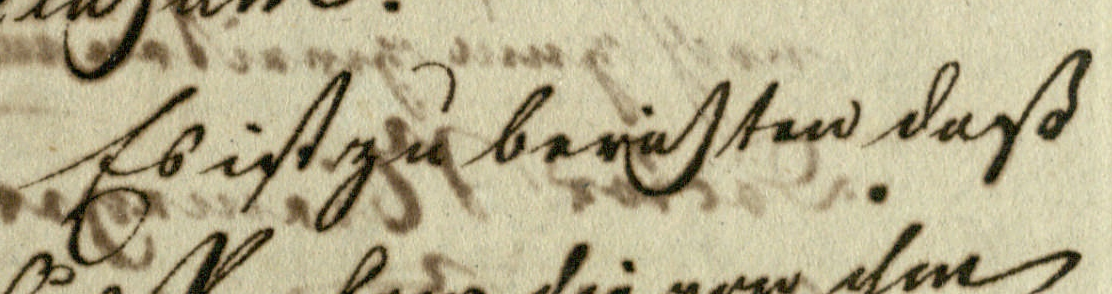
Es ist zu berichten daß
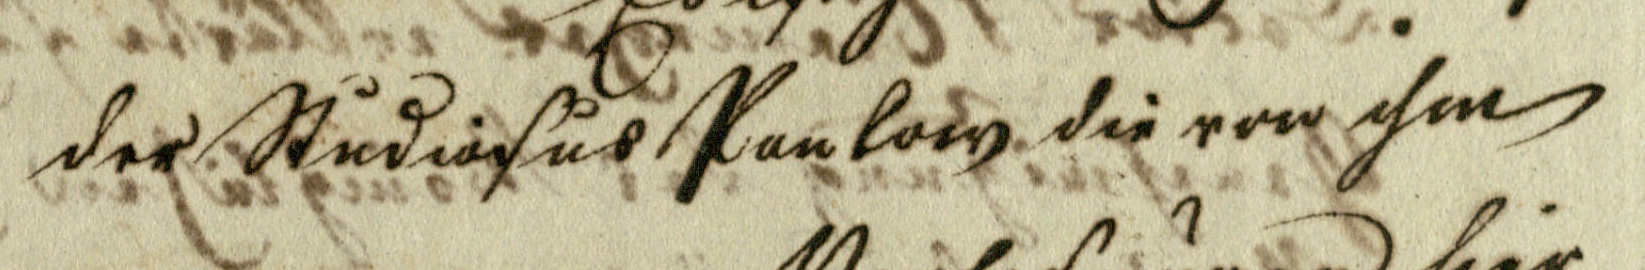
der Studiosus Pankow die von ihm
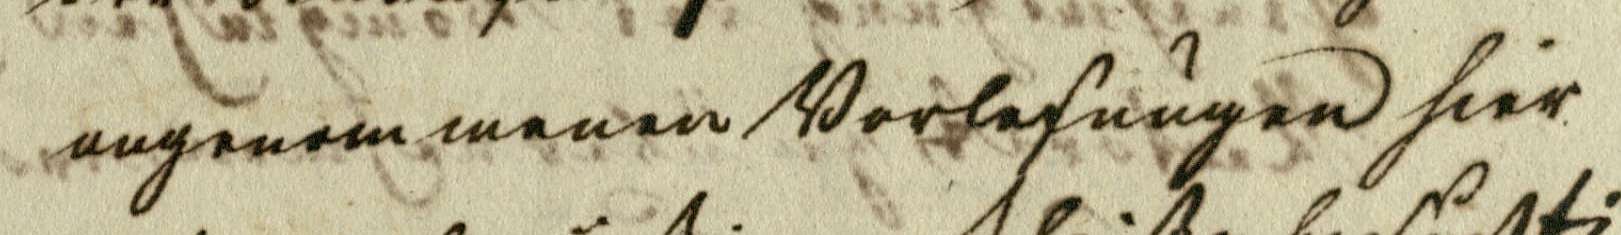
angenommenen Vorlesungen hier
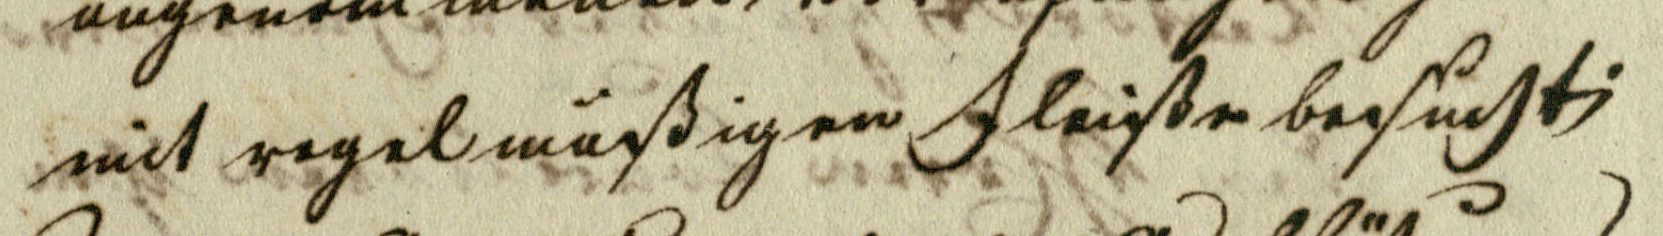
mit regelmäßigen Fleiße besucht;
